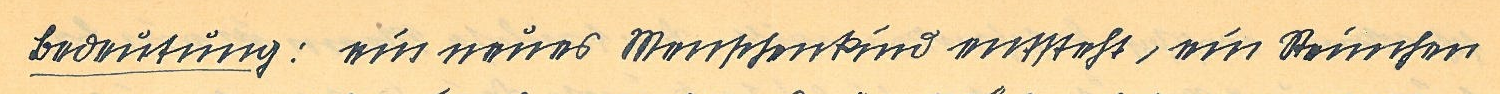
Bedeutung: ein neues Menschenkind entsteht, ein Steinchen
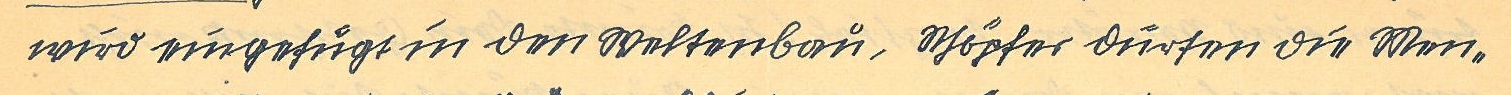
wird eingefügt in den Weltenbau, Schöpfer dürfen die Men¬
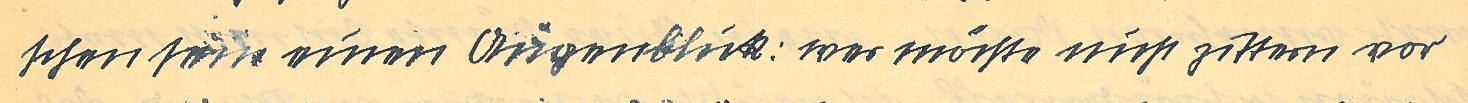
schen sein einen Augenblick: wer möchte nicht zittern vor
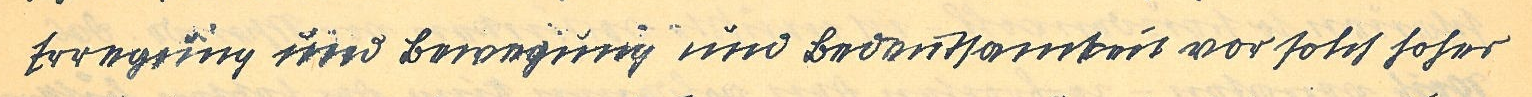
Erregung und Bewegung und Bedeutsamkeit vor solch hoher
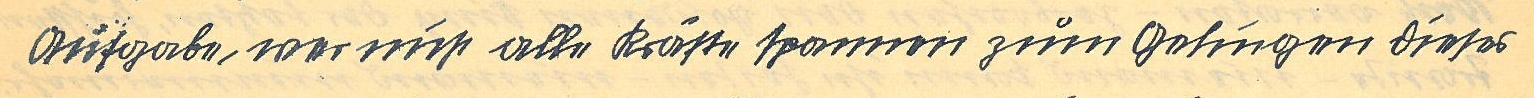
Aufgabe, wer nicht alle Kräfte spannen zum Gelingen dieses
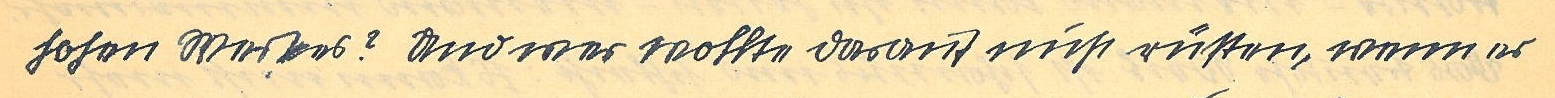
hohen Werkes? Und wer wollte darauf nicht rüsten, wenn er
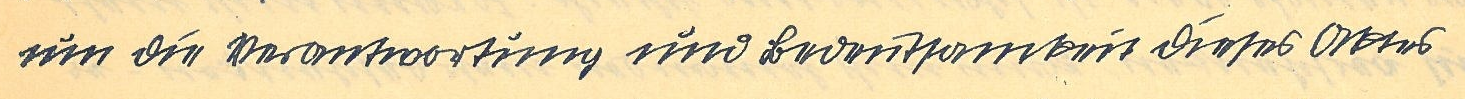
nun die Verantwortung und Bedeutsamkeit dieses Aktes
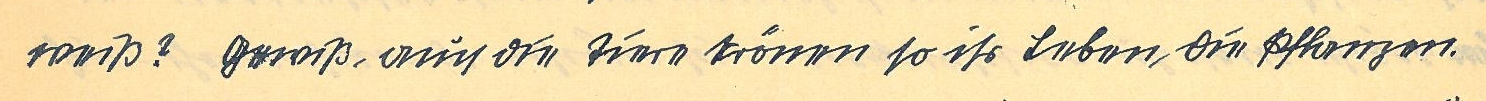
weiß? Gewiß, auch die Tiere krönen so ihr Leben, die Pflanzen.
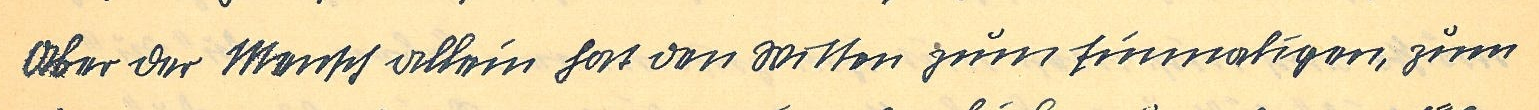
Aber der Mensch allein hat den Willen zum Einmaligen, zum
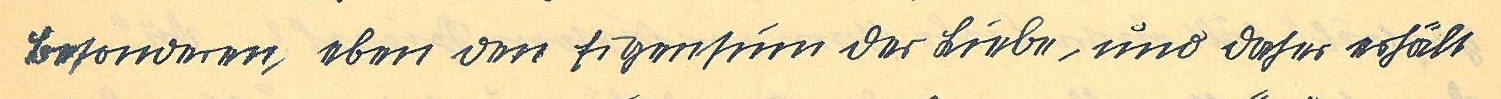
Besonderen, eben den Eigensinn der Liebe, und daher erhält
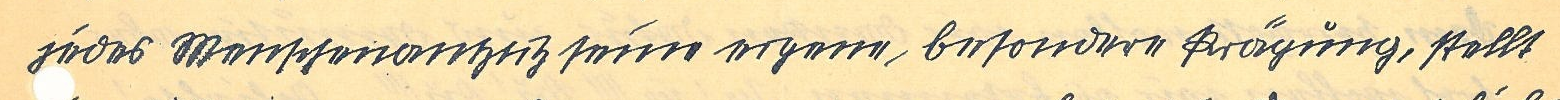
jedes Menschenantzlitz seine eigene, besondere Prägung, stellt
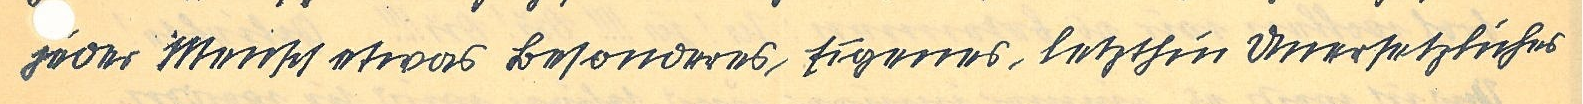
jeder Mensch etwas Besonderes, Eigenes, letzthin Unersetzliches
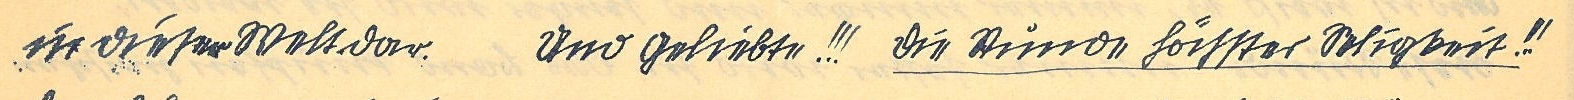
in dieser Welt dar. Und Geliebte!!! Die Stunde höchster Seligkeit!!!
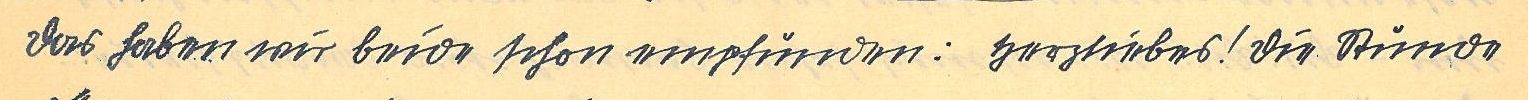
Das haben wir beide schon empfunden: Herzliebes! Die Stunde
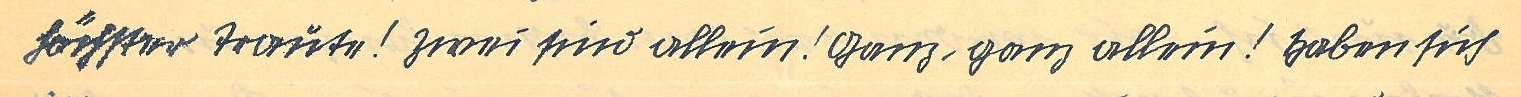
höchster Traute! Zwei sind allein! Ganz, ganz allein! Haben sich
